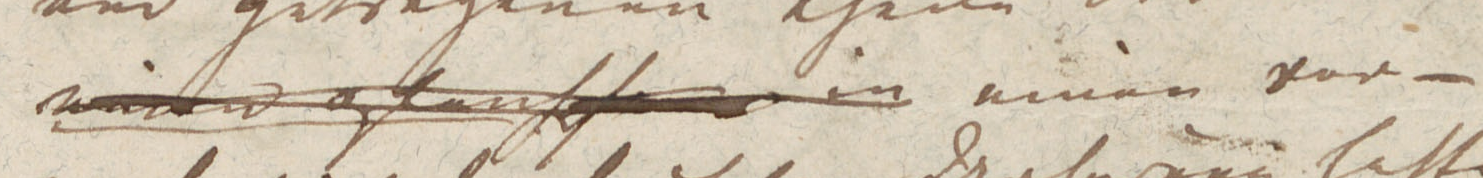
vielen gleichsam in einen vor-
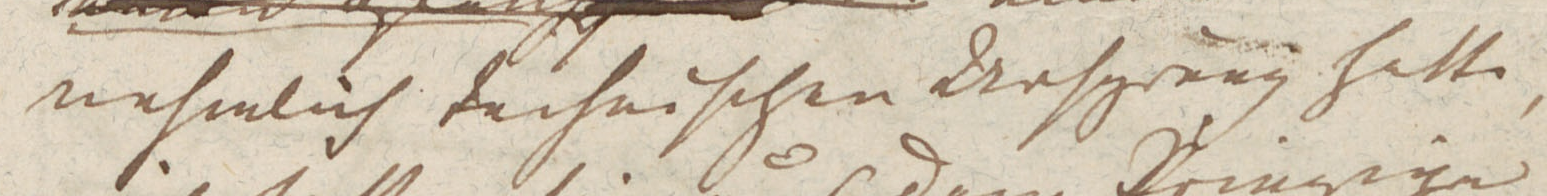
nehmlich technischen Ursprung hatte;
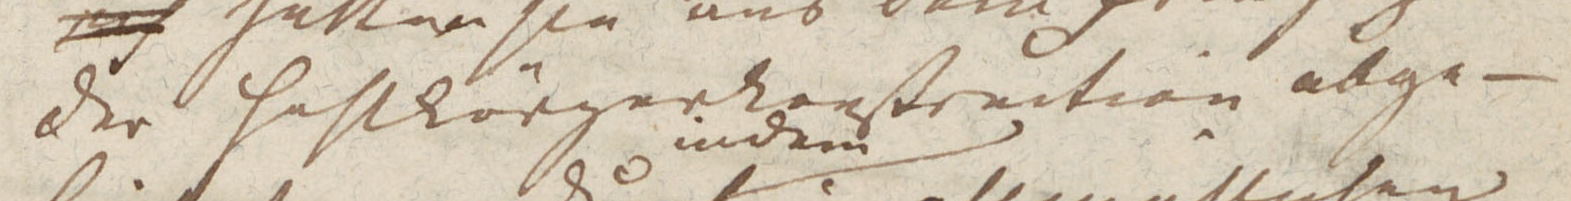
der Hohlkörperkonstruction abge-
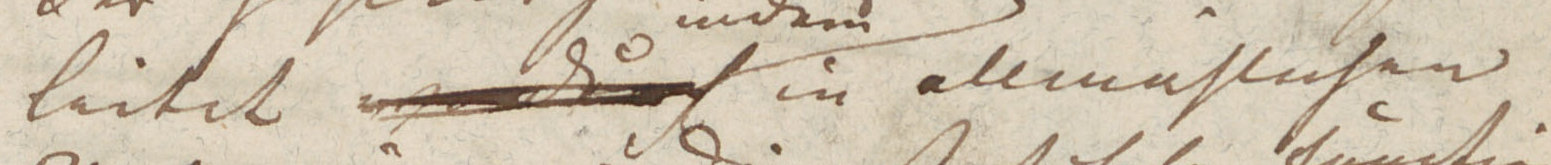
leitet wodurch indem in allmählichen
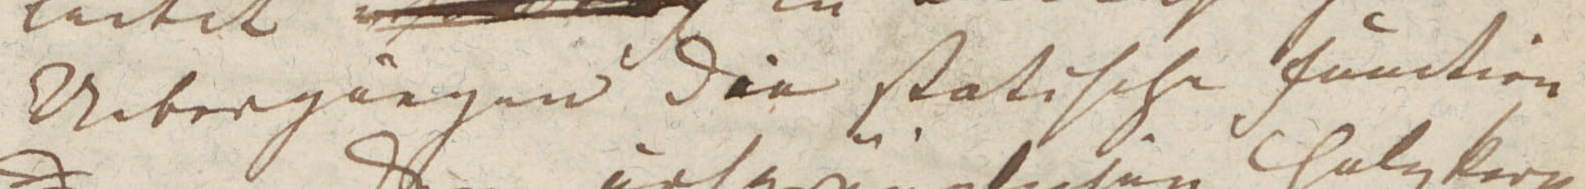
Uebergängen die statische Function
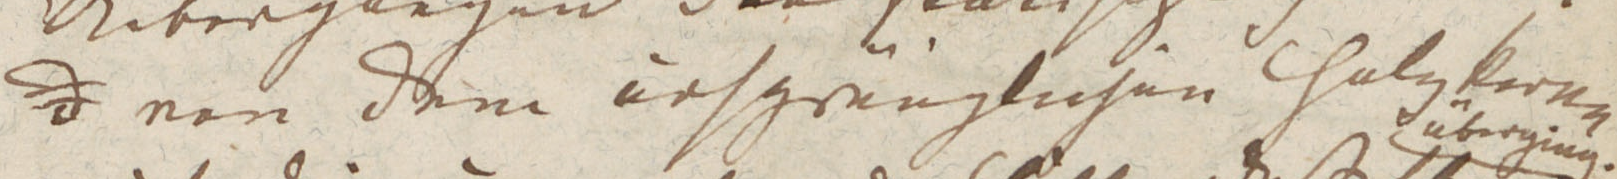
d von dem ursprünglichen Holzkerne
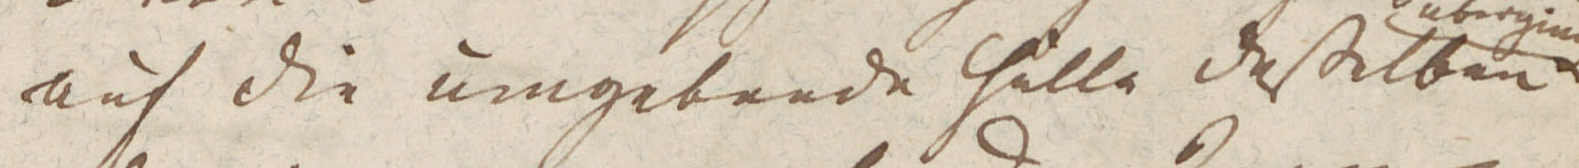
auf die umgebende Hülle desselben
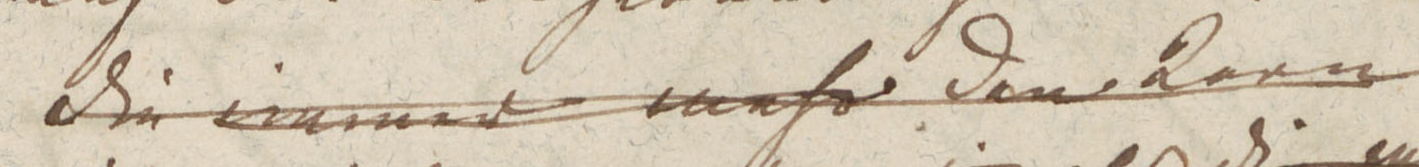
Die immer mehr den Kern
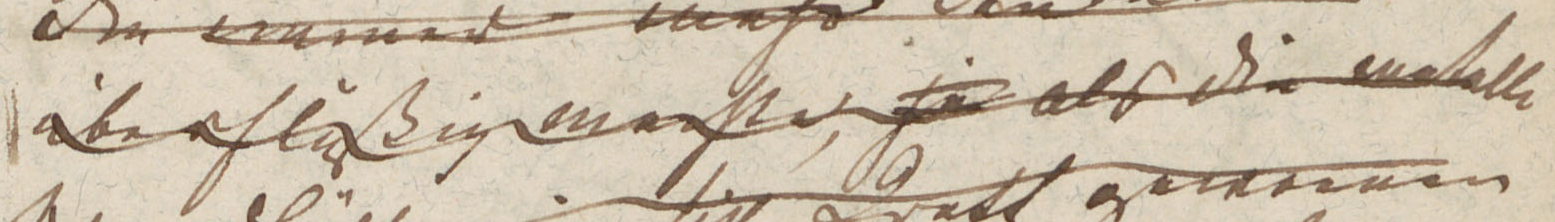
überflüssig machte, ja als die metalli
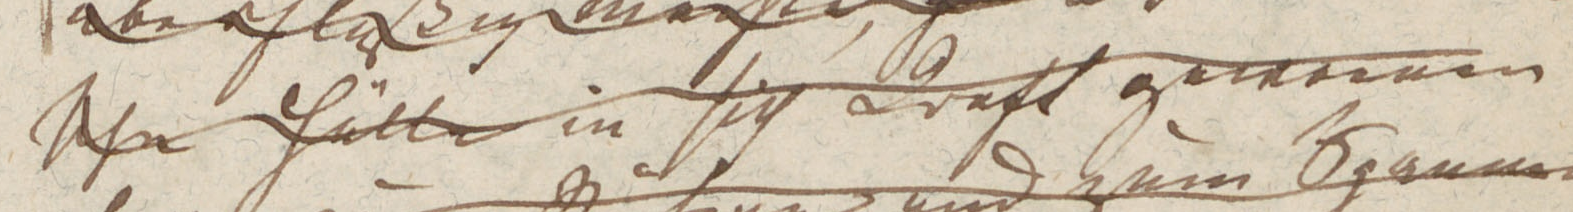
sche Hülle in sich Kraft gewonnen
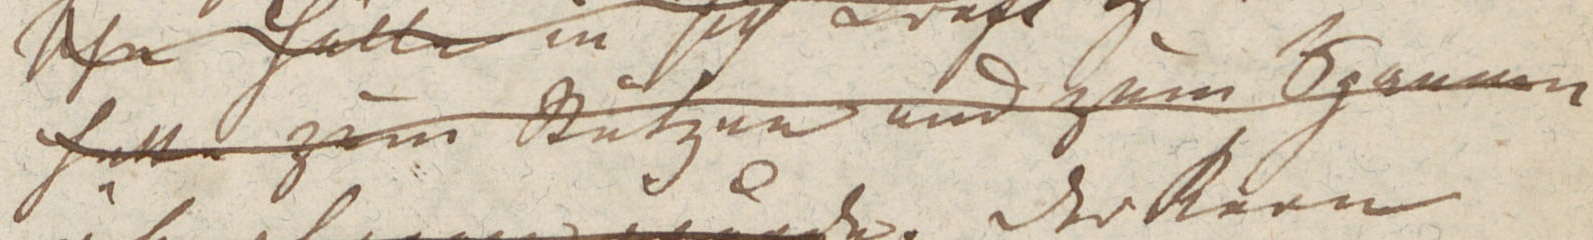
hatte zum Stützen und zum Spannen
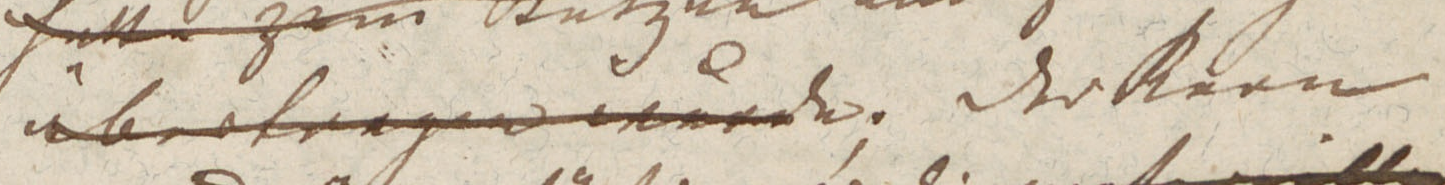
übertragen wurde; Der Kern
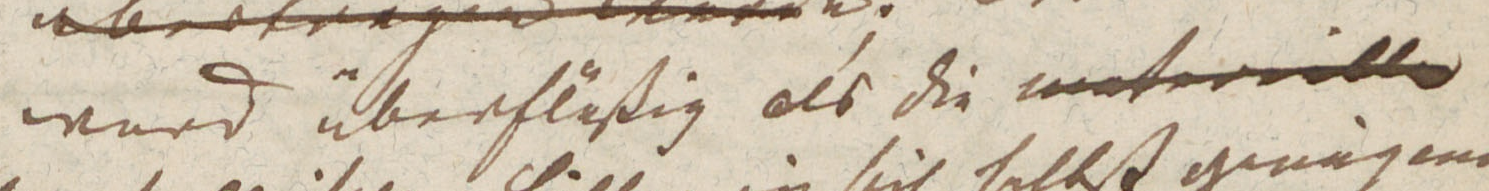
ward überflüssig als die materielle
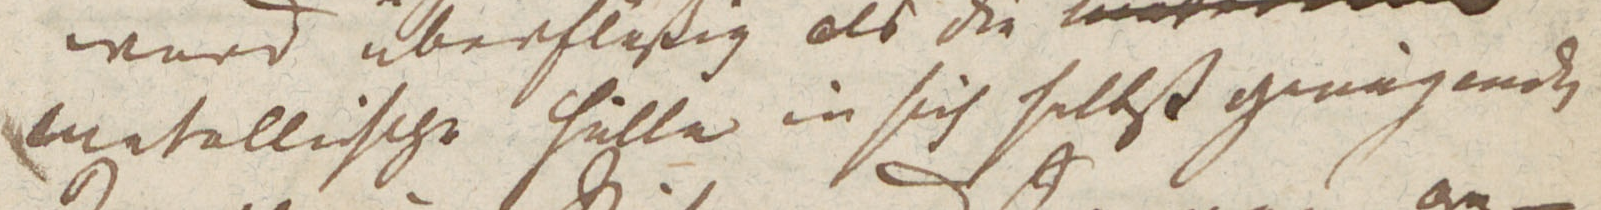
metallische Hülle in sich selbst genügende
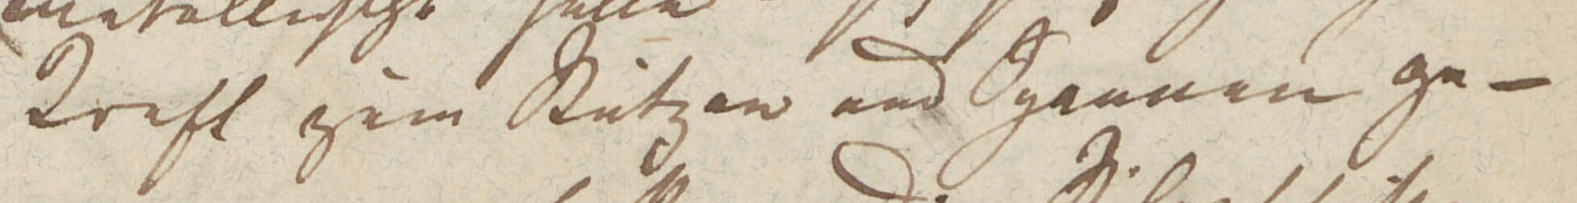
Kraft zum Stützen und Spannen ge-
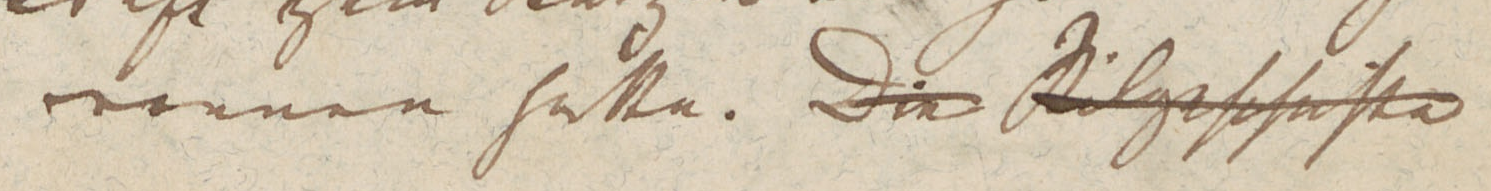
wonnen hatte. Die Stilgeschichte
